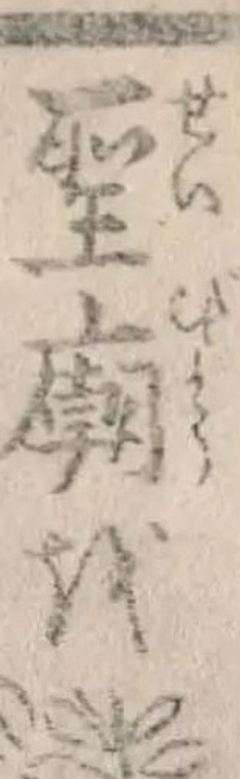聖廟を
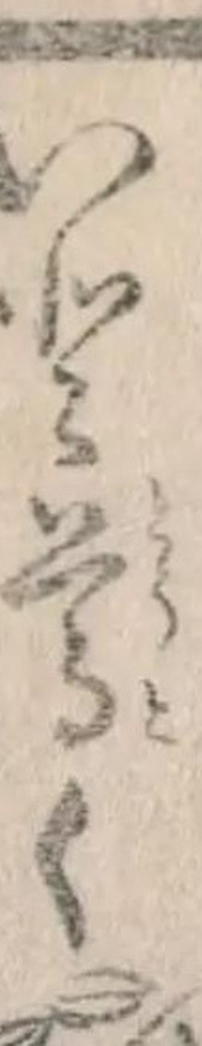いと尊く
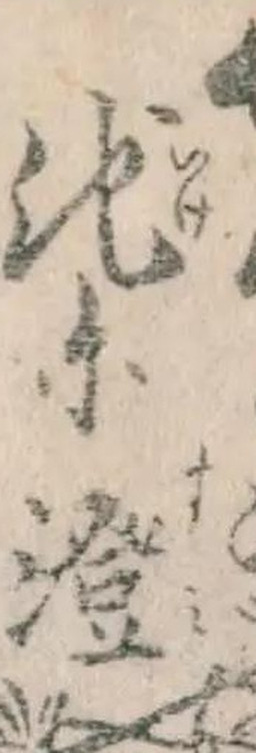池に澄
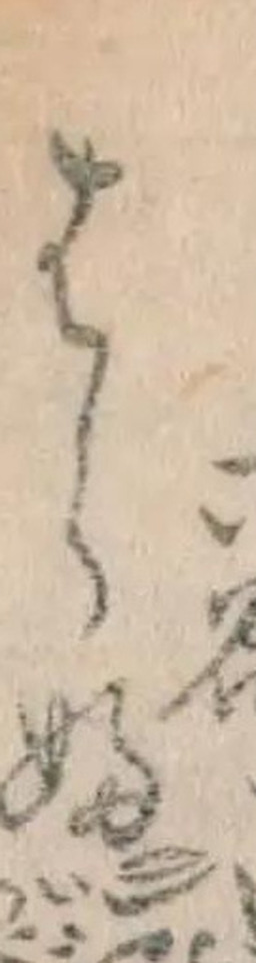はらふ
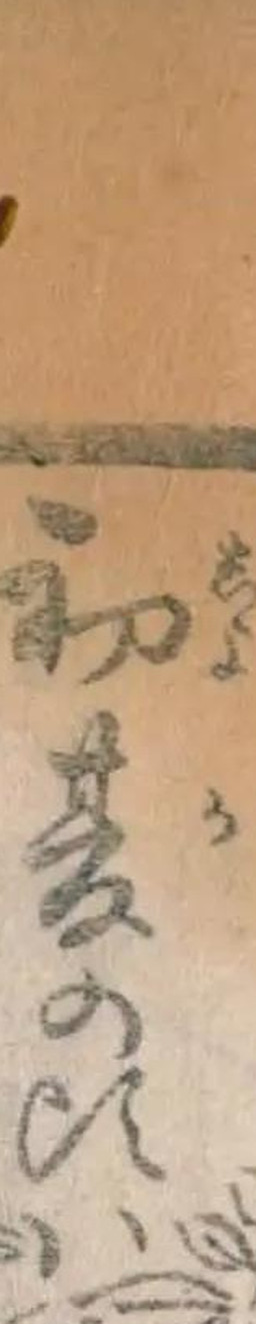初夏の頃は
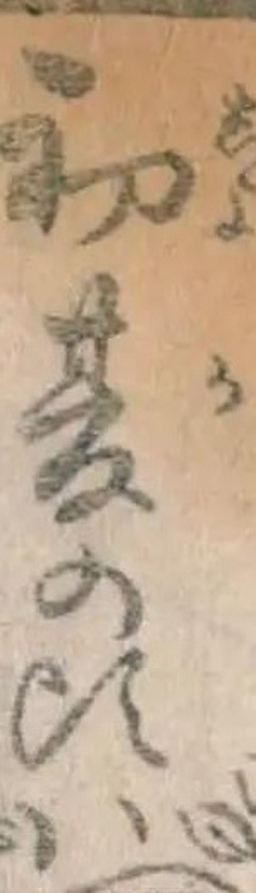初夏の頃は
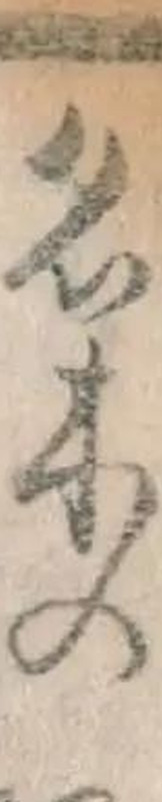名木の
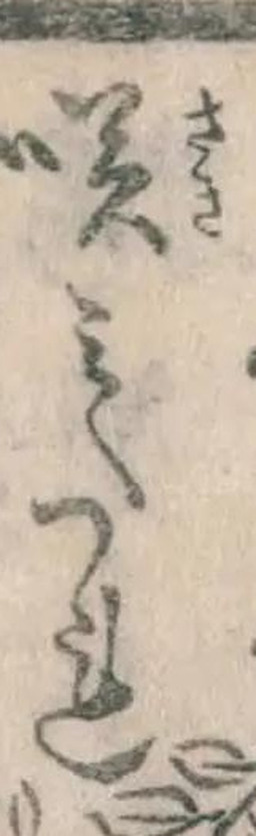咲みたれ
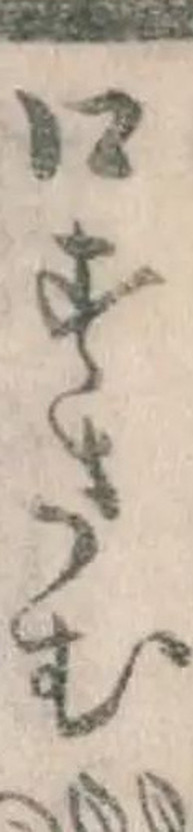口すさむ
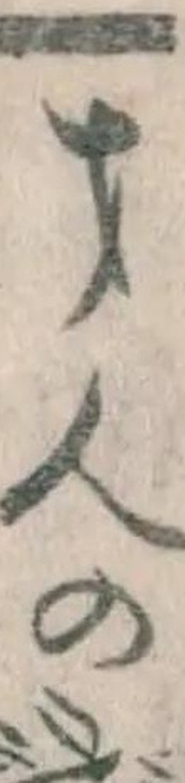才人の
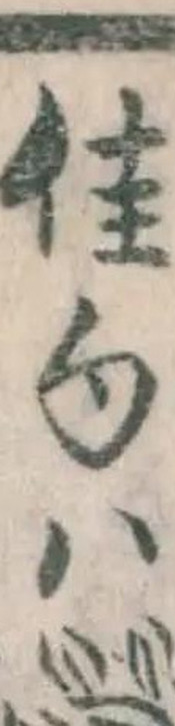佳句は
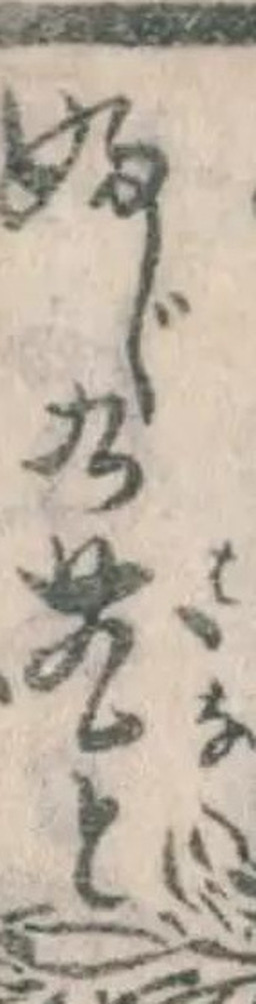ふじの花と
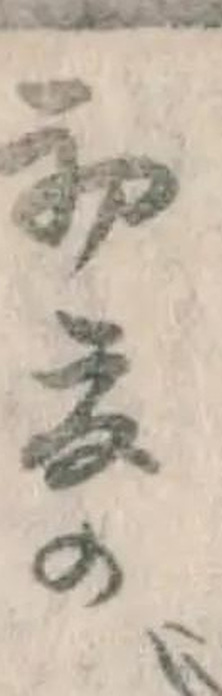初夏の
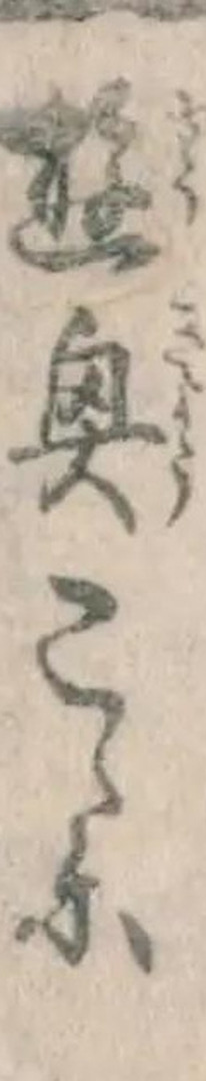遊興こゝに

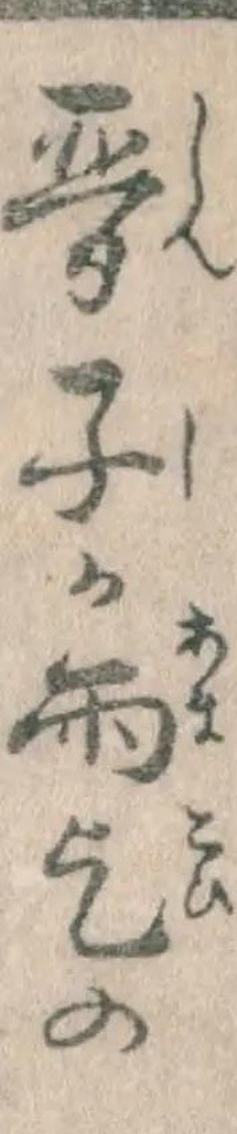晋子か雨乞の
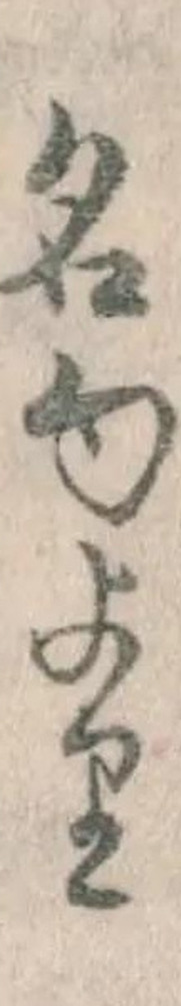名句より
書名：絵本物見岡
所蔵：国立国会図書館 National Diet Library, JAPAN
